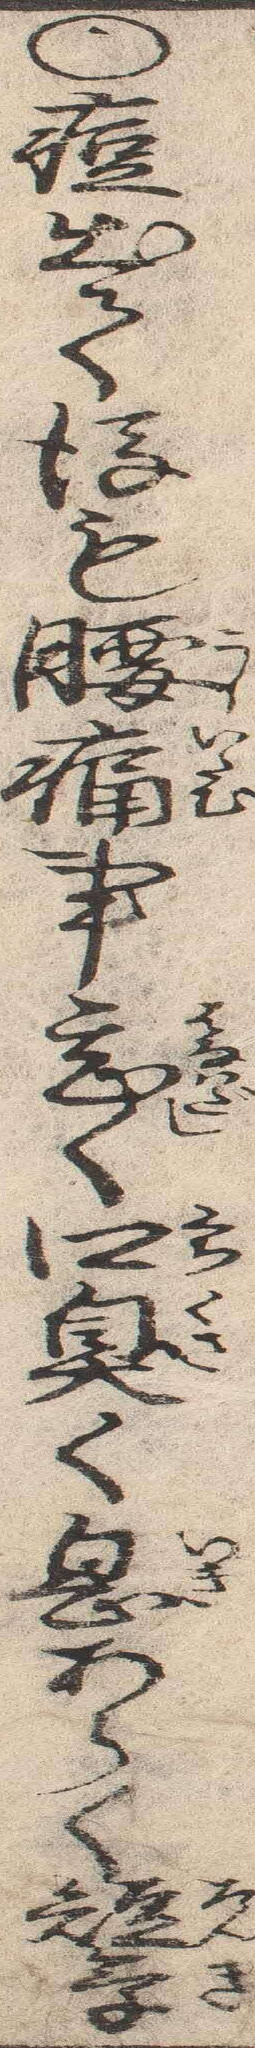○痘出て後も腰痛事甚く口臭く息あらく短気
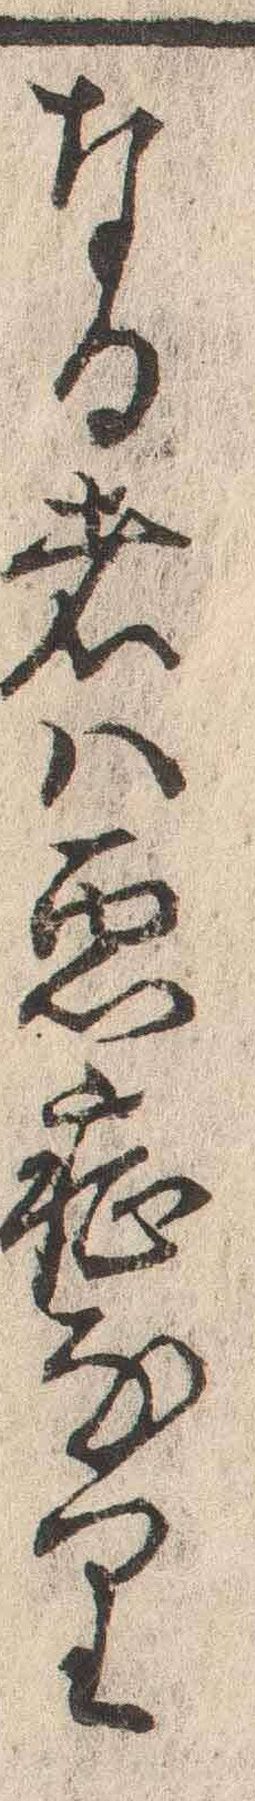なる者は悪症なり
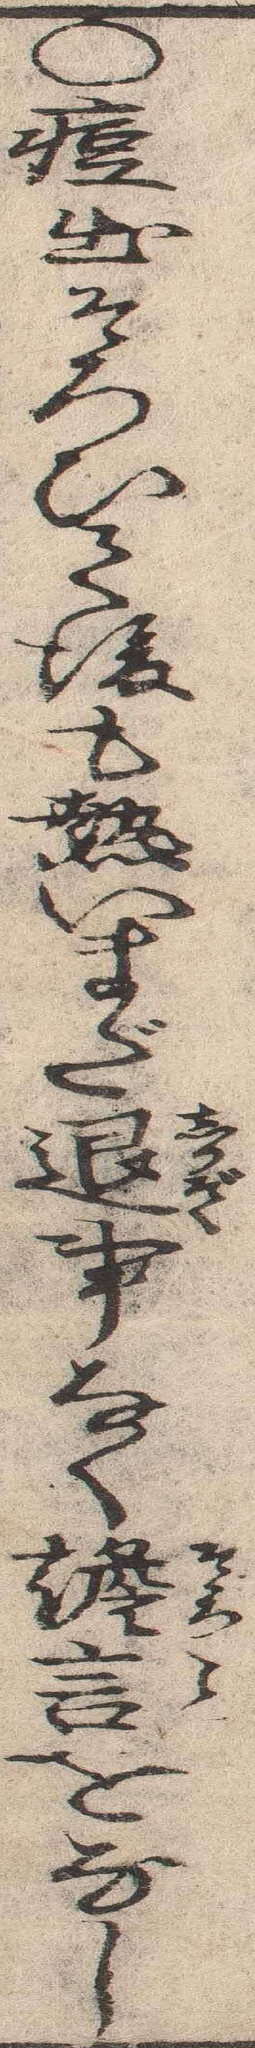○痘出そろひて後も熱いまだ退事なく譫言をなし

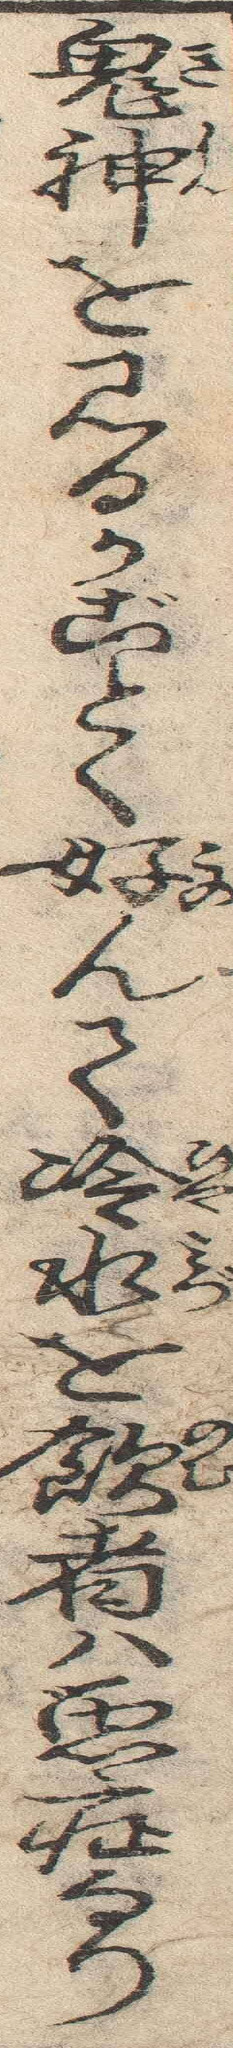鬼神を見るかごとく好んて冷水を飲者は悪症なり
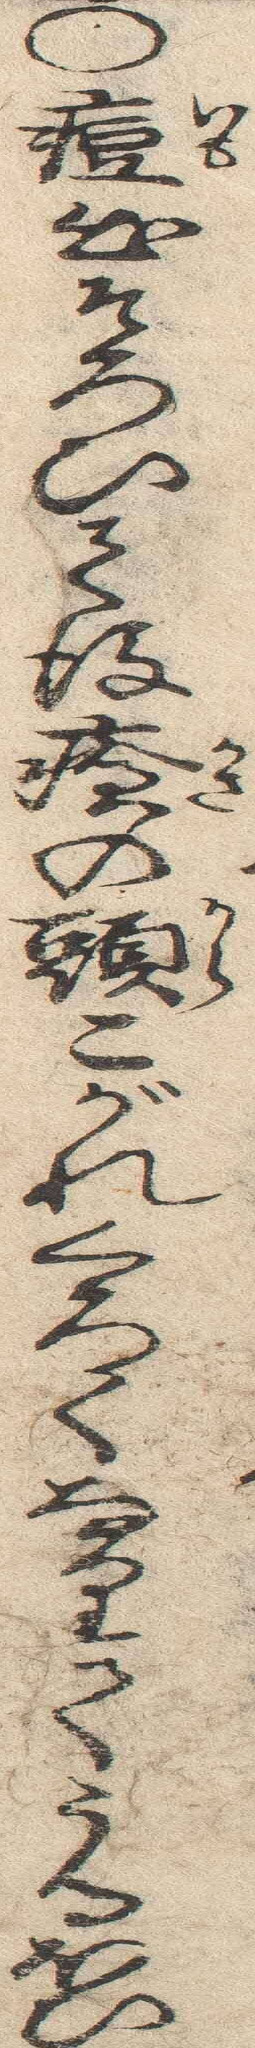○痘出そろひて後瘡の頭こがれくろくなりてうるほひ
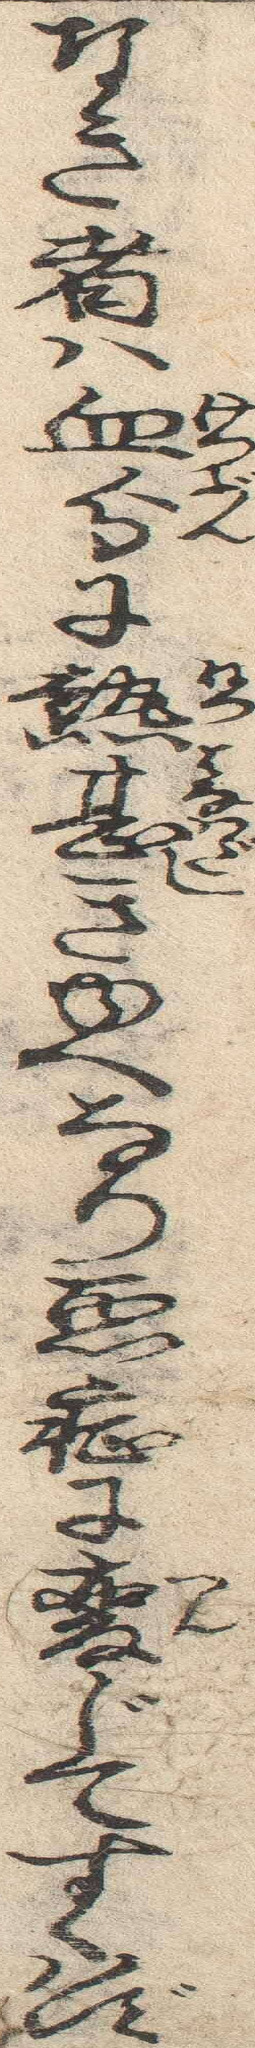なき者は血分に熱甚きゆへなり悪症に変じてすくはず
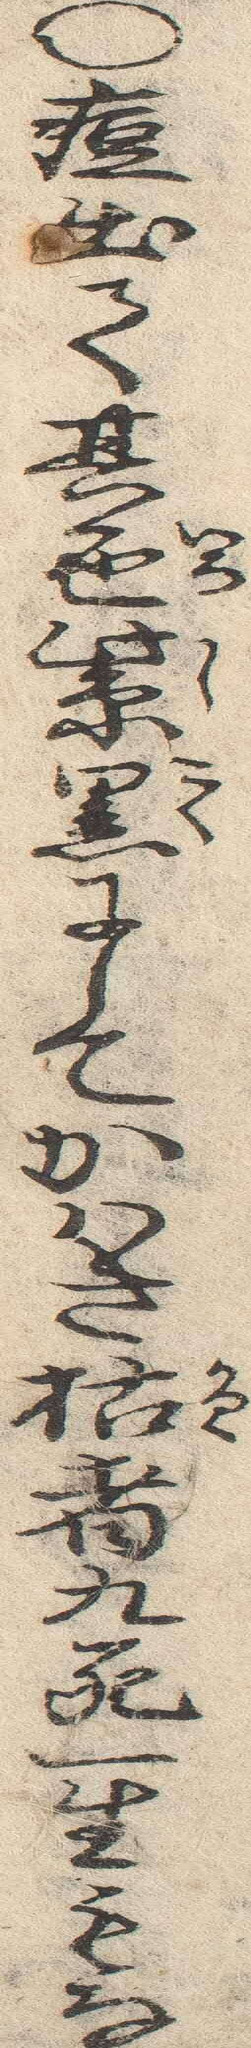○痘出て其色紫黒にしてかはき枯者九死一生もな
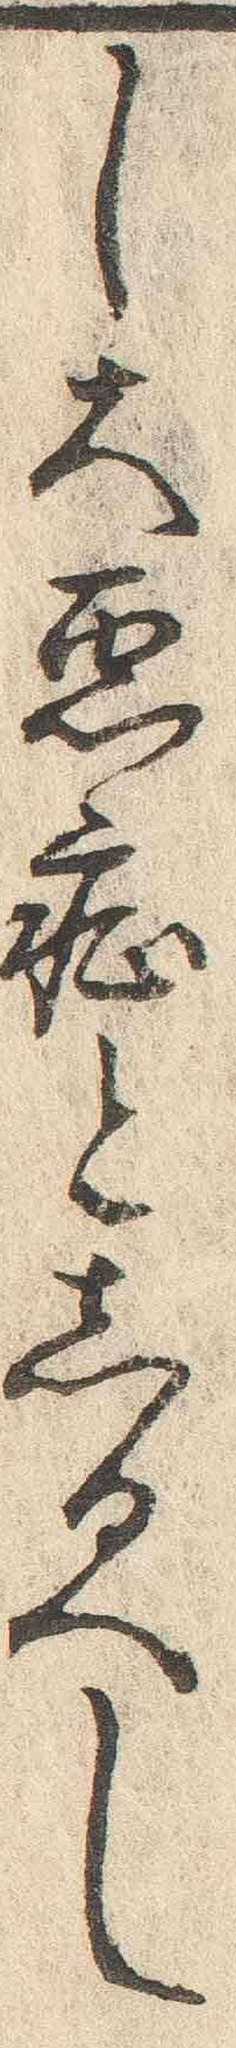し大悪症としるへし
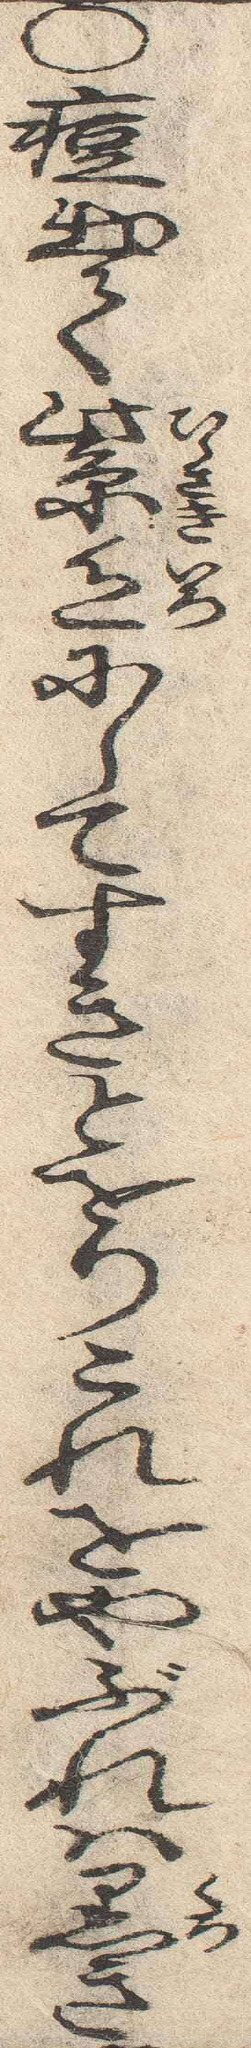○痘出て紫色にしてすきとをりこれをやぶれは黒き
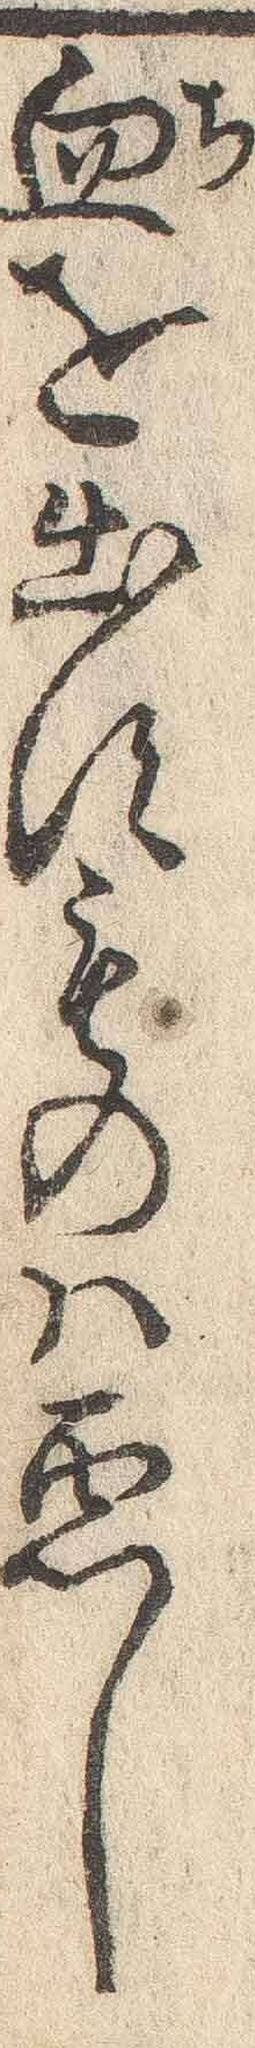血を出すものは悪し
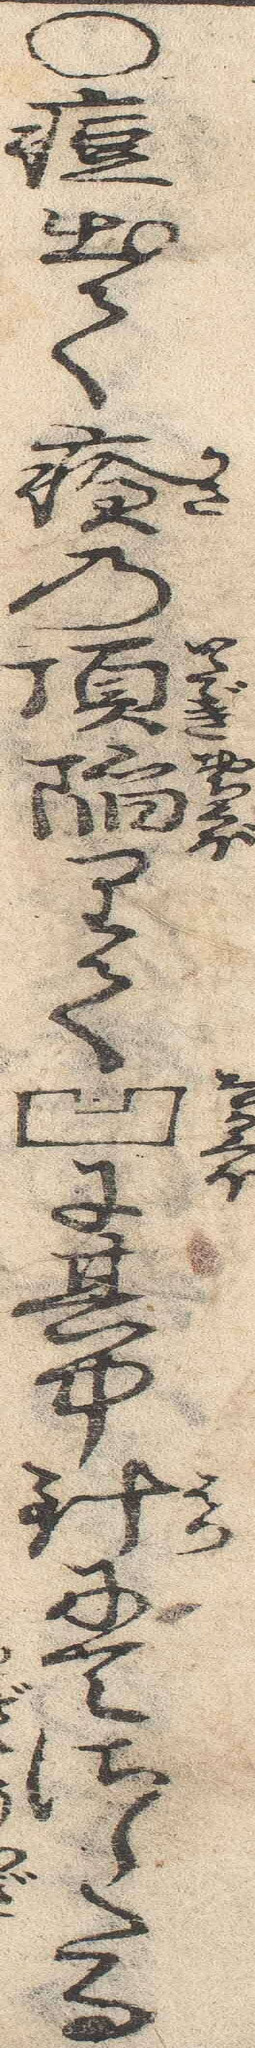○痘出て瘡の頂陥りて凹に其中針にてさしたる
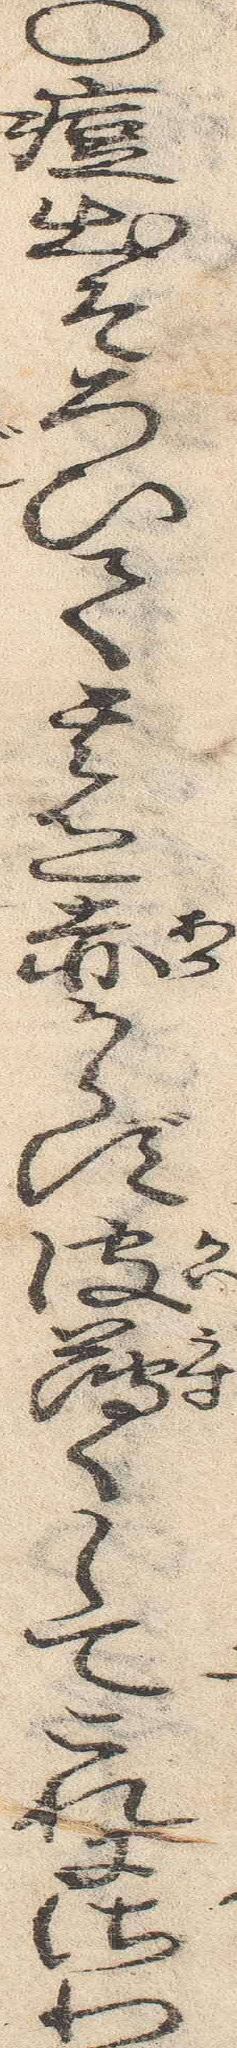○痘でそろひて其色赤からず皮薄くしてこれにさわ
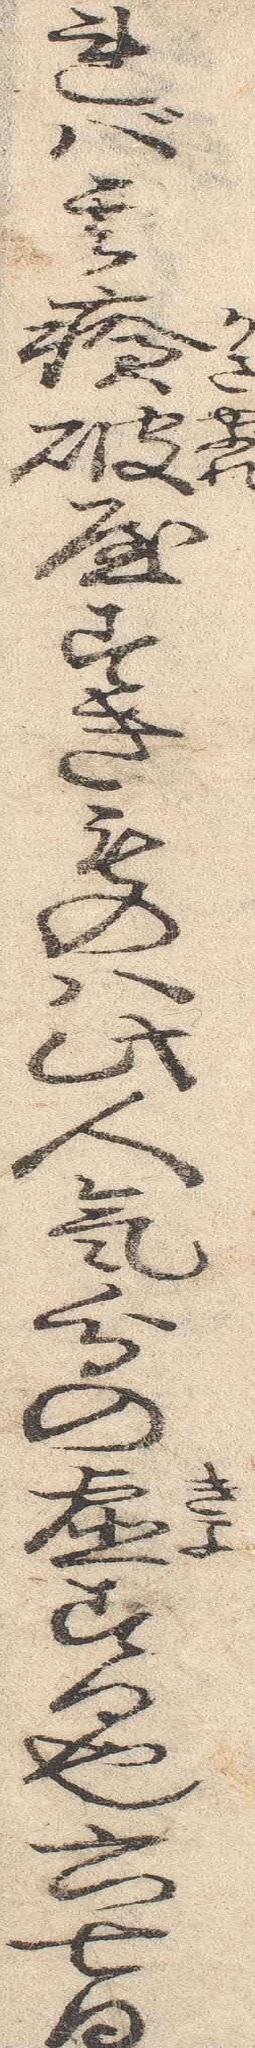れば其瘡破やすきものは此人気分の虚する也六七日

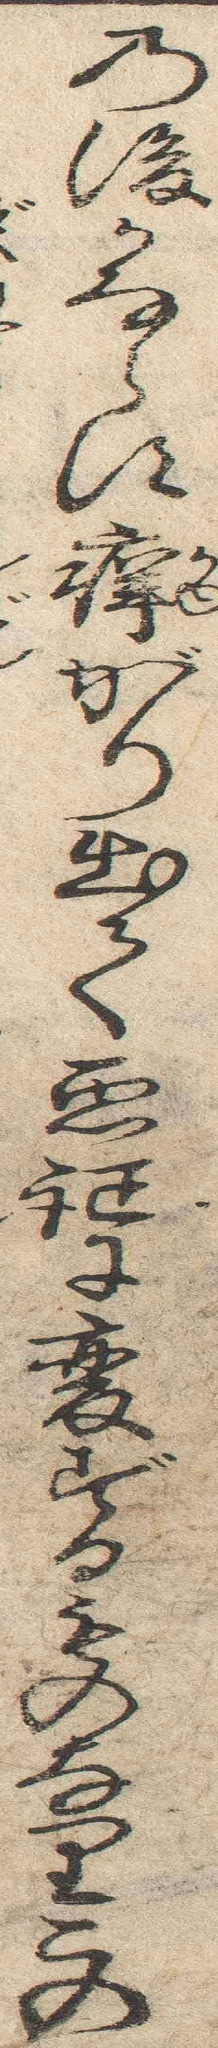の後かならす痒がり出て悪証に変ずるものなりこの
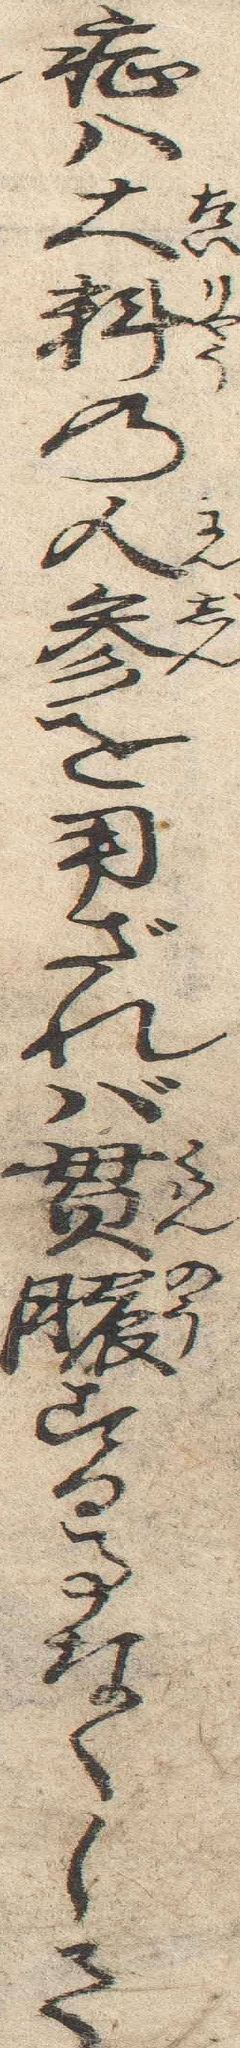症は大料の人参を用ざれば貫膿する事なくして
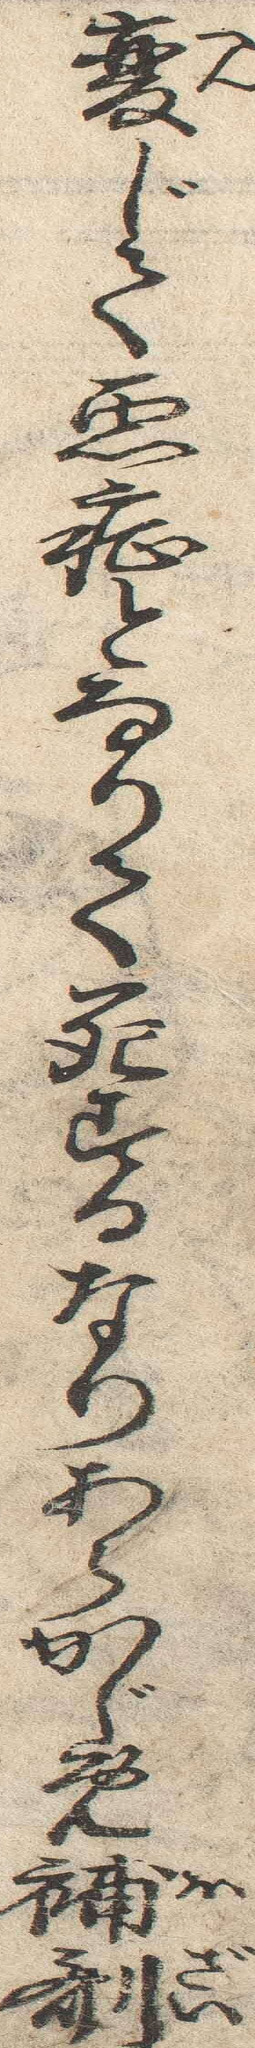変じて悪症となりて死するなりあらかじめ補剤
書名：小児必用養育草
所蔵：東京学芸大学附属図書館 国文学研究資料館
